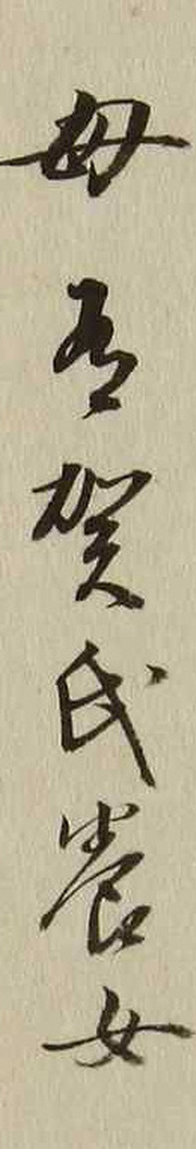母有賀氏養女
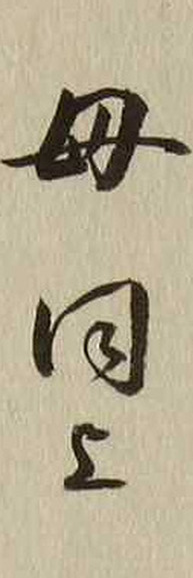母同上
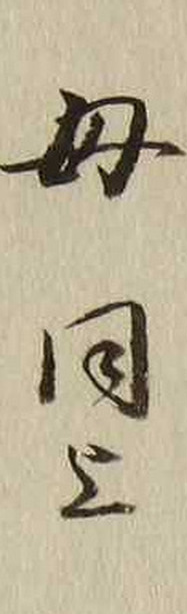母同上
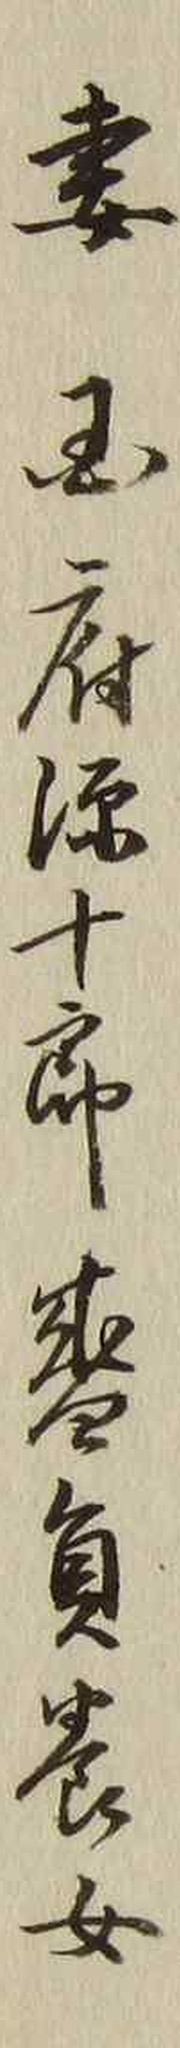妻国府源十郎盛員養女
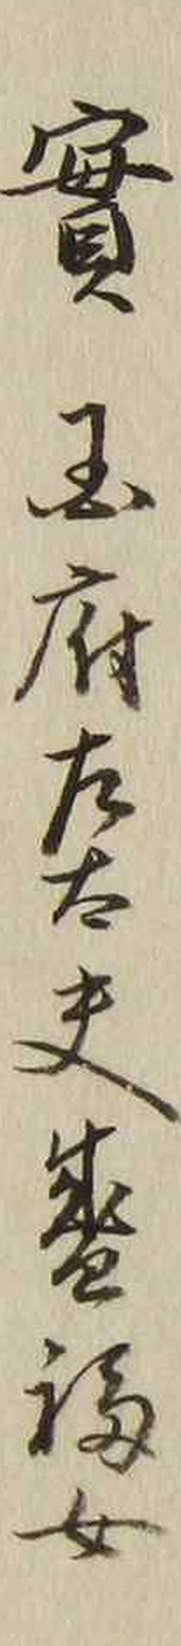実国府左太夫盛福女

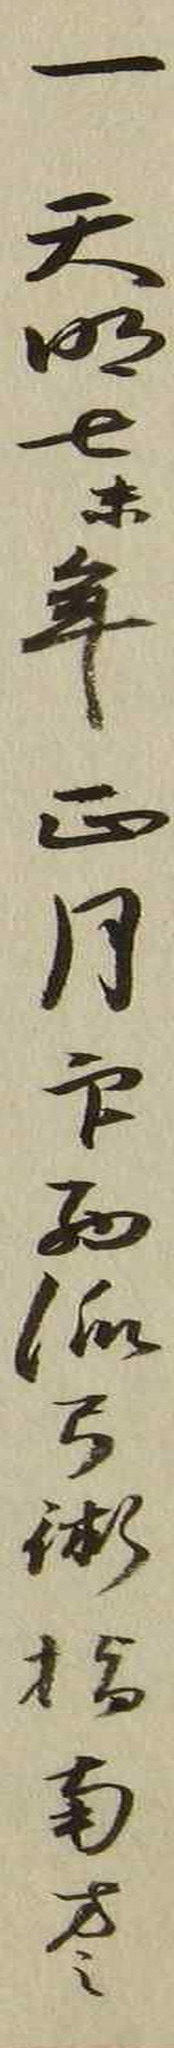一天明七未年正月印西派弓術指南方之
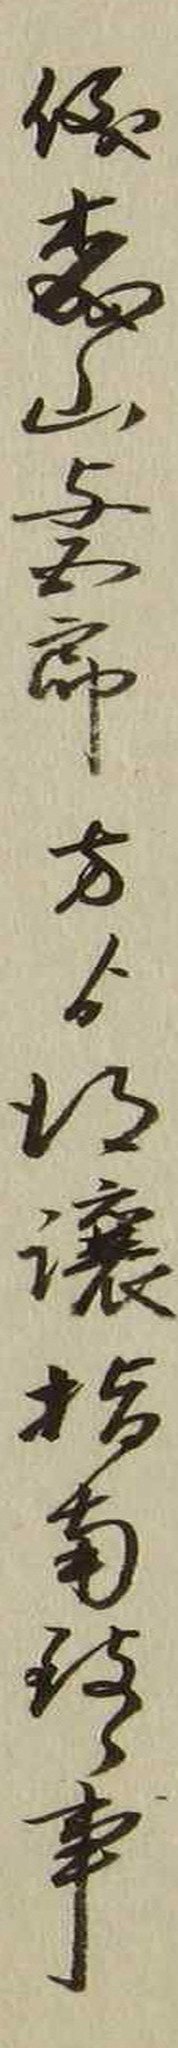儀森山与五郎方ゟ得譲指南致候事
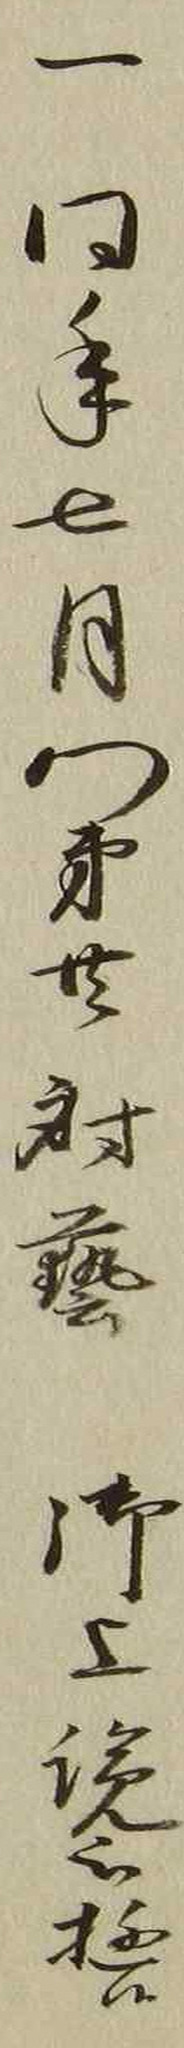一同年七月門弟共射芸御上覧被遊候
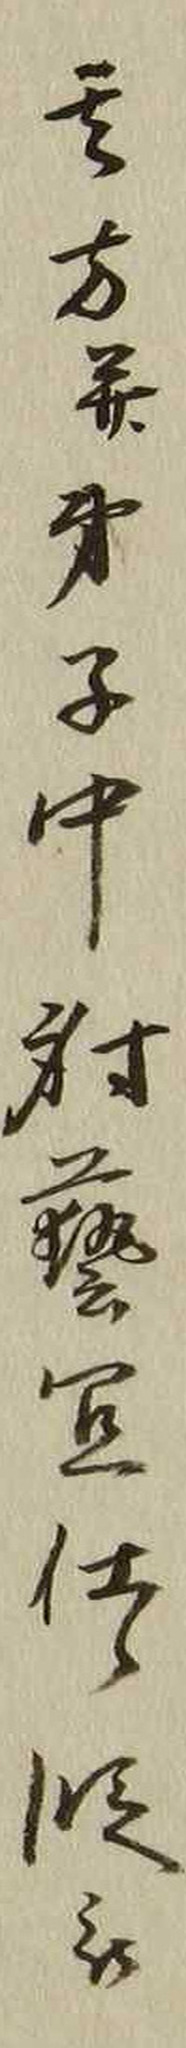其方幷弟子中射芸宜仕候段被
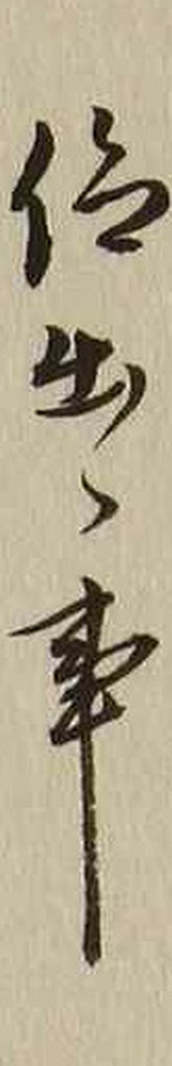仰出候事
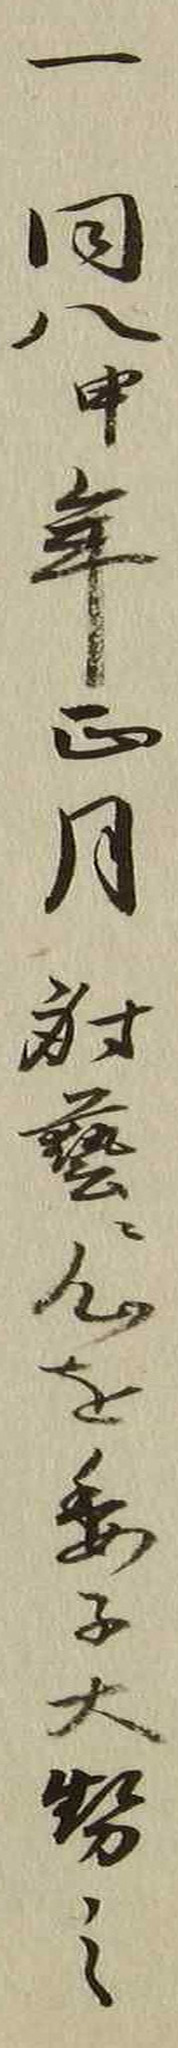一同八申年正月射芸ニ心を委子大勢之
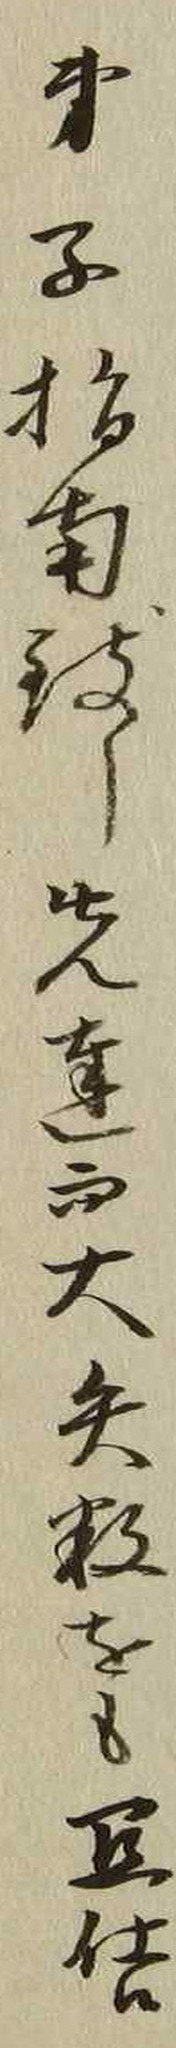弟子指南致し先達而大矢数をも宜仕候
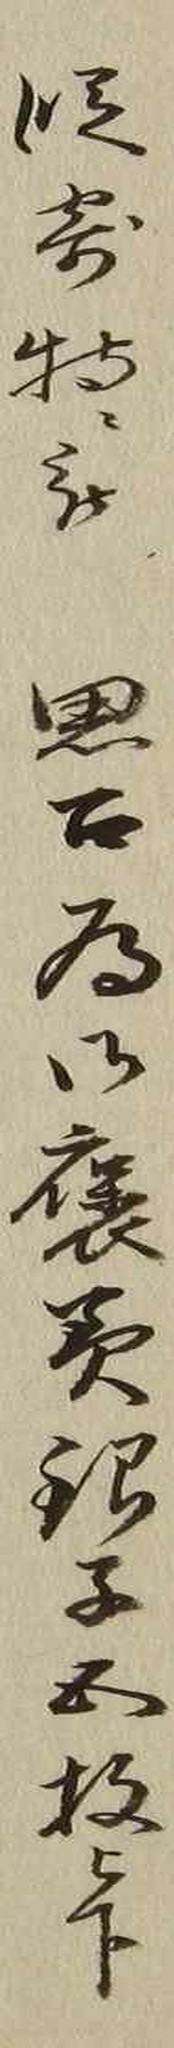段寄特ニ被思召為御褒美銀子五枚被下
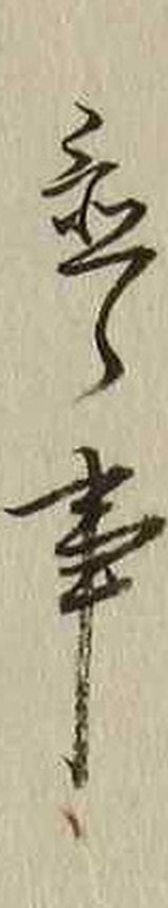置候事
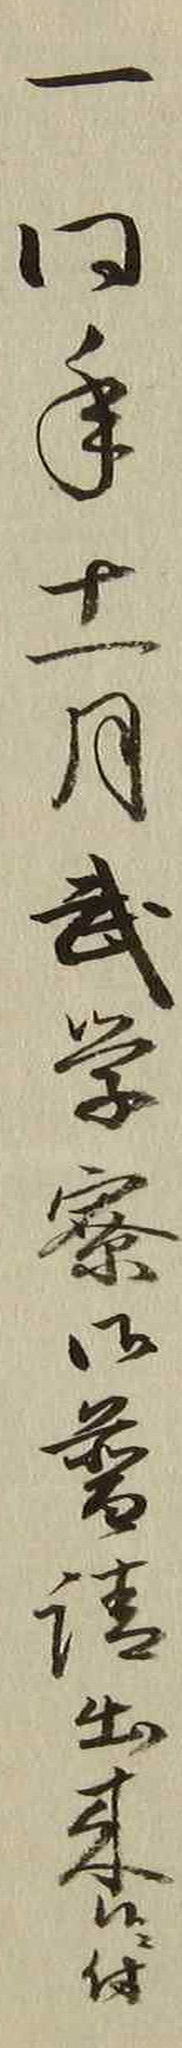一同年十一月武学寮御普請出来候ニ付
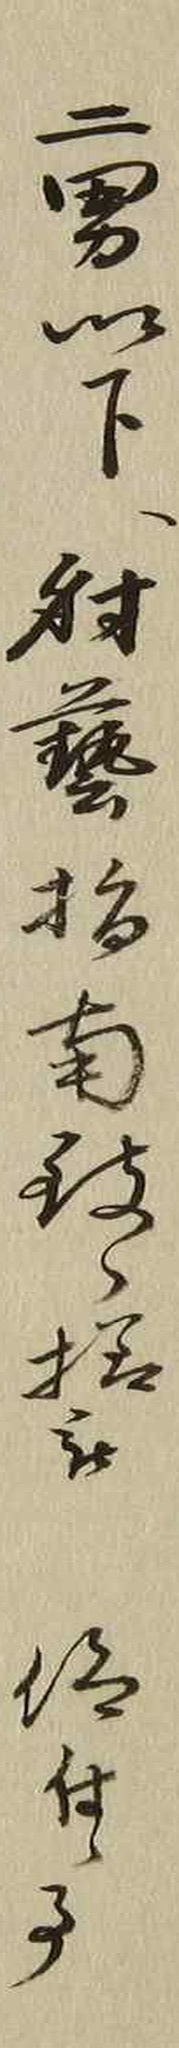二男以下へ射芸指南致候様被仰付候事
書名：諸士系譜　巻之69　を之部3
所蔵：会津若松市立会津図書館
